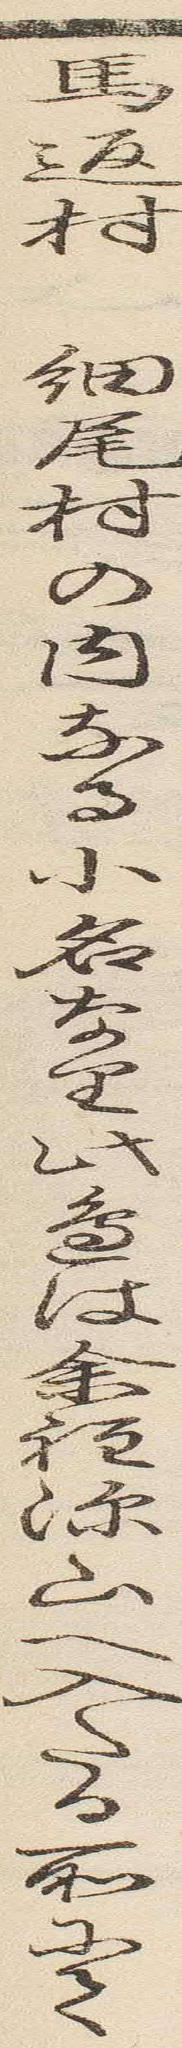馬返村細尾村の内なる小名なり此邊は余程深山へ入たる所にて
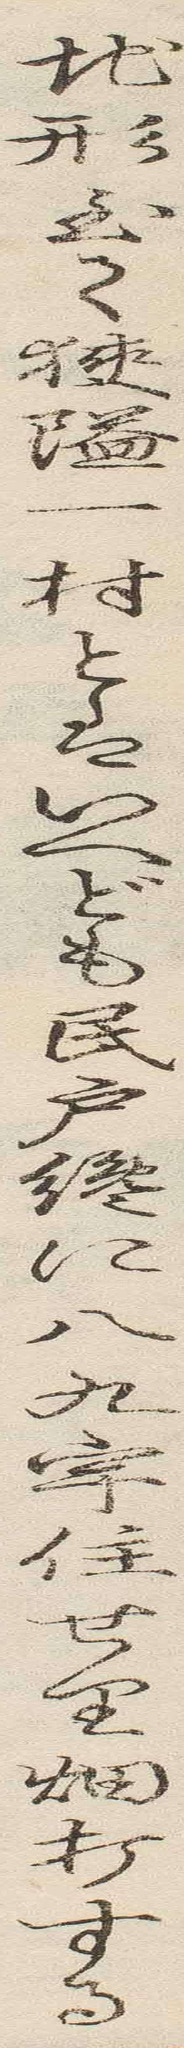地形至て狹隘一村とはいへども民戸纔に八九宇住せり畑打する
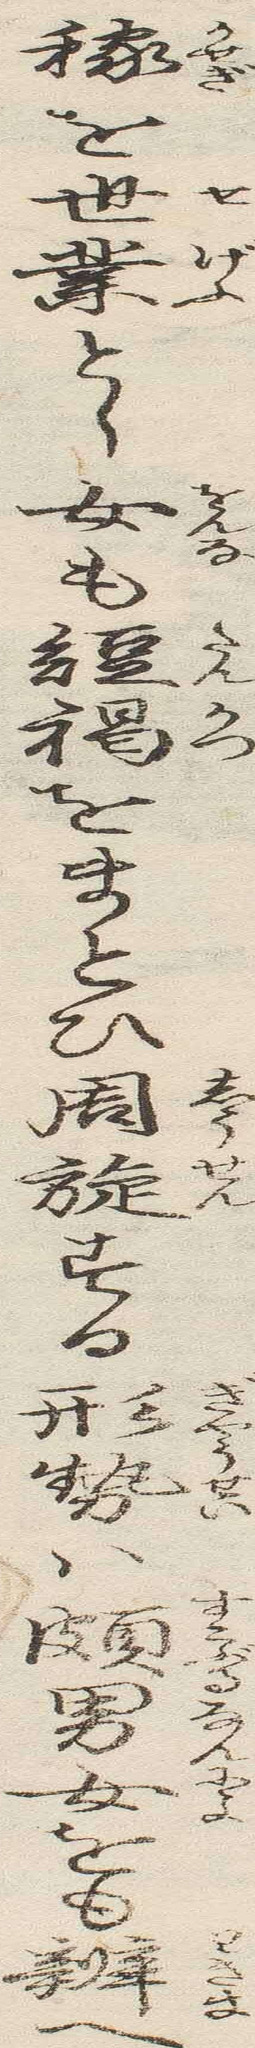稼を世業とし女も短褐をまとひ周旋する形㔟は頗男女をも辨へ
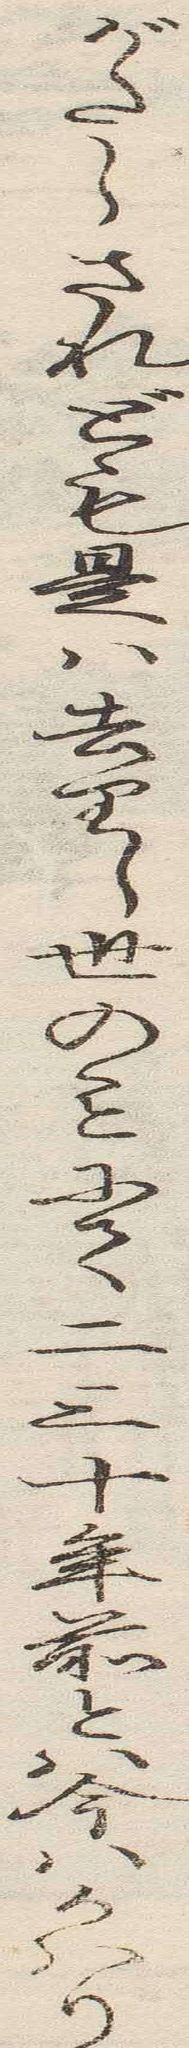がたしされども是は去りし世のことにて二三十年前とは今はかはり
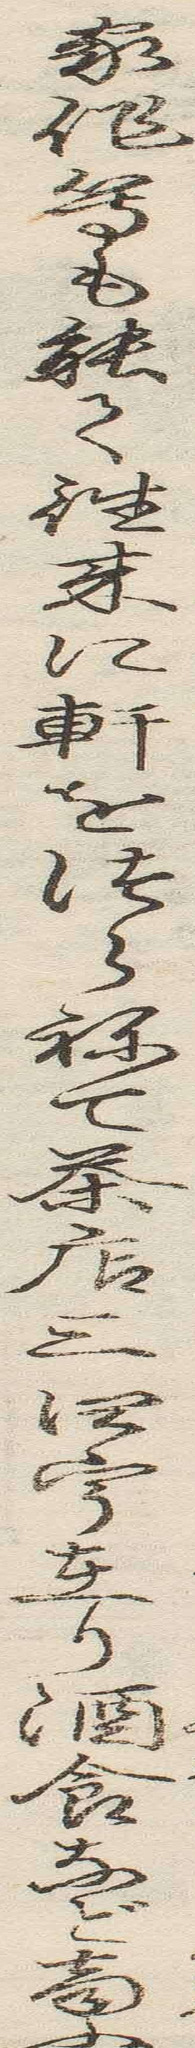家作等も能て徃來に軒をつらねて茶店三四宇在り酒食など商ふ
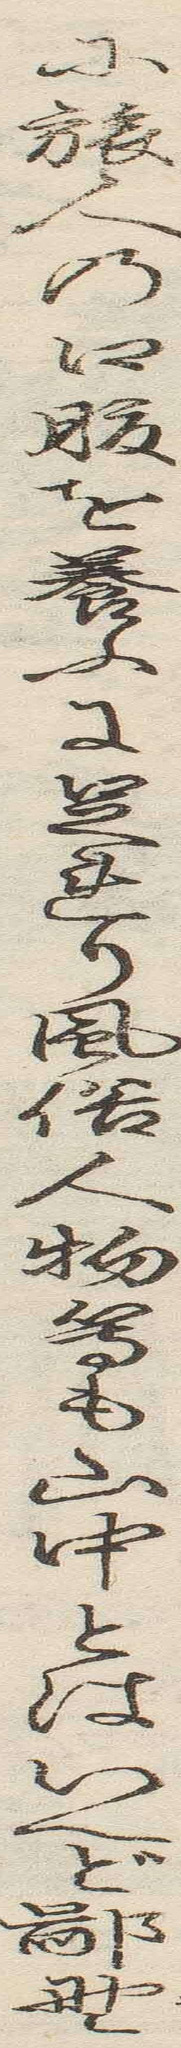に旅人の口腹を養ふに足れり風俗人物等も山中とはいへど鄙㙒
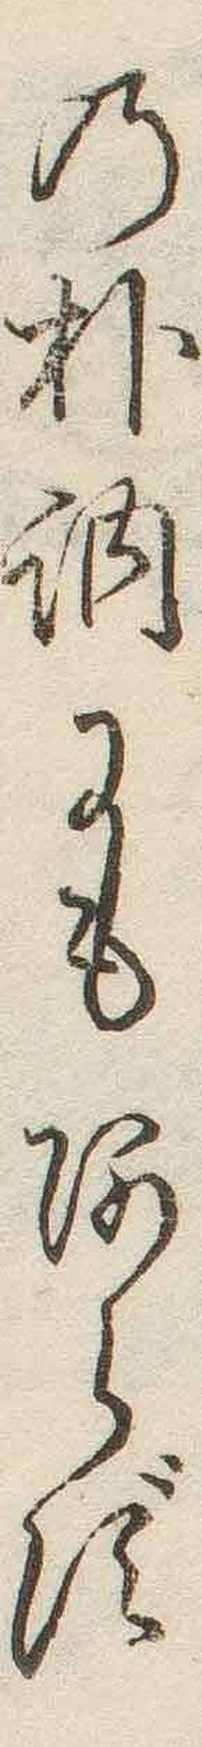の朴訥にもあらず
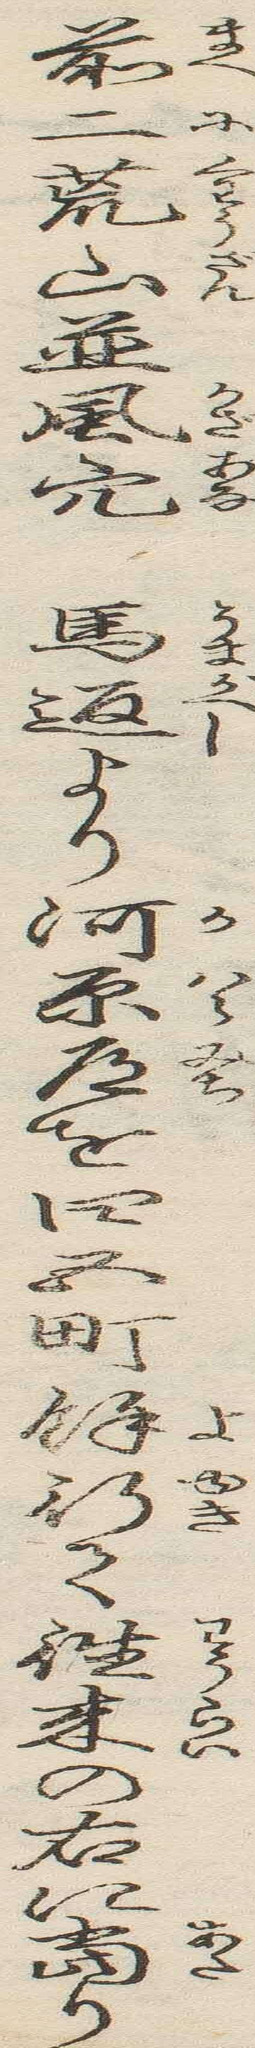前二荒山並風穴馬返より河原道を四五町餘行て徃來の右に當り
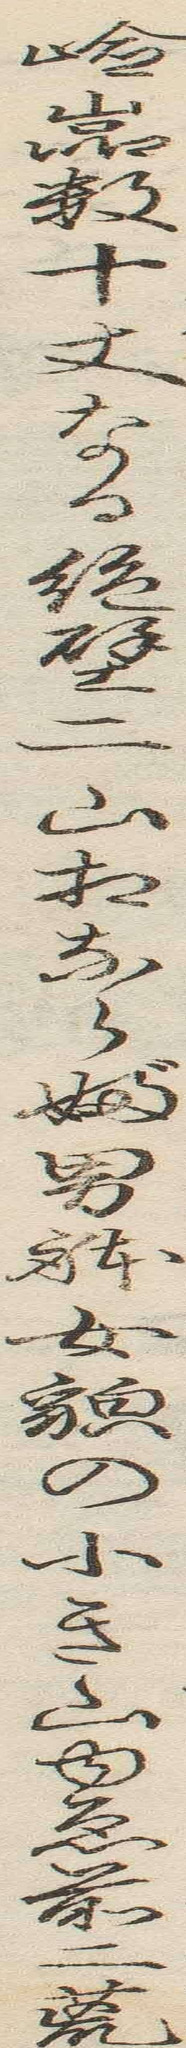嶮嵓数十丈なる絶壁二山相ならぶ男躰女貌の小き山ゆゑ前二荒
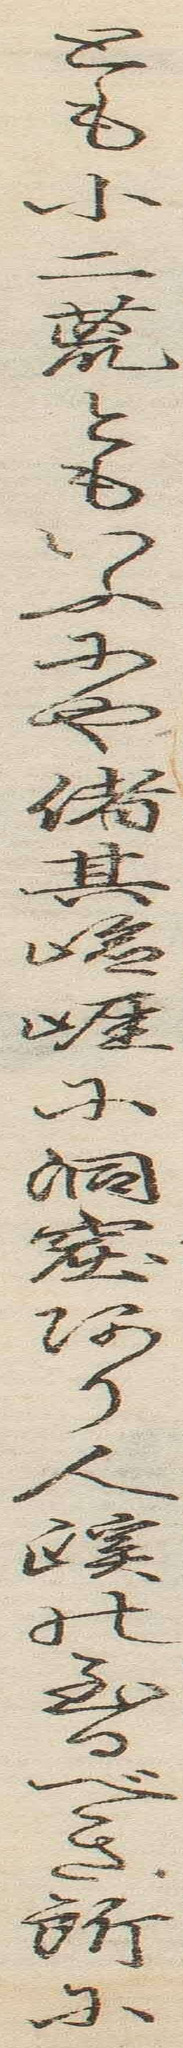とも小二荒ともいふにや偖其嶮崕に洞窟あり人蹊の至るべき所に
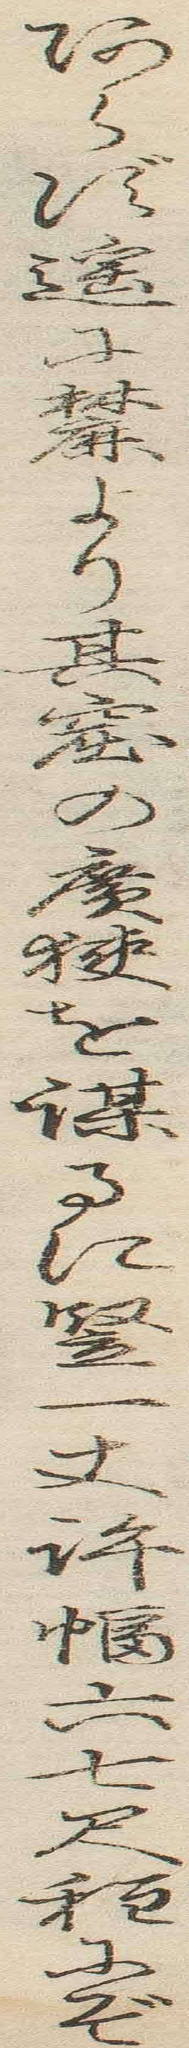あらず遥に麓より其窟の廣狹を謀るに竪一丈許幅六七尺程にぞ
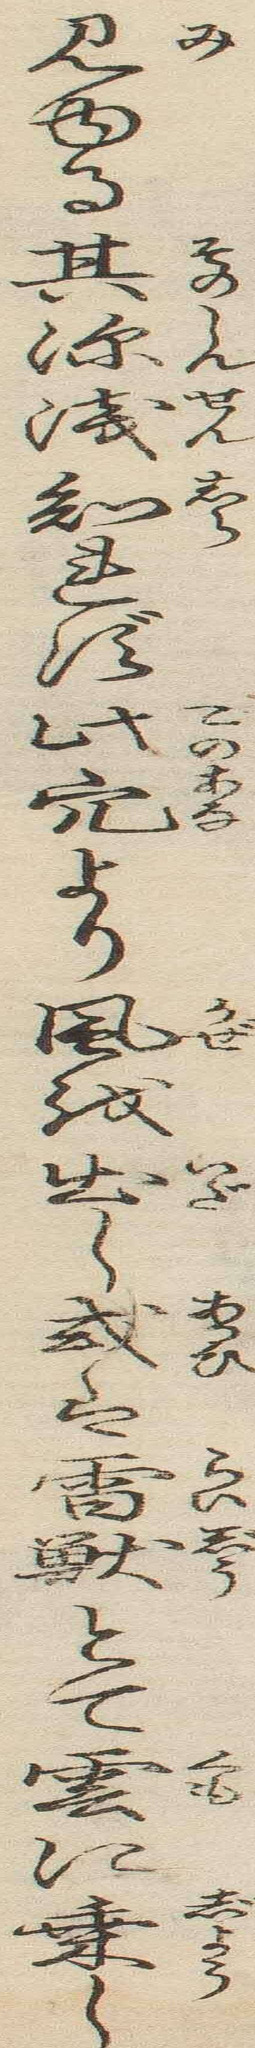見ゆる其深淺知れず此穴より風を出し或は雷獣とて雲に乗し

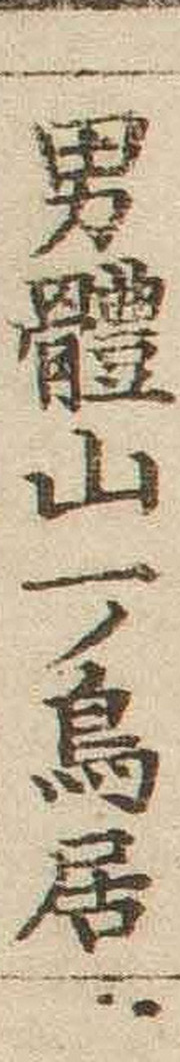男體山一ノ鳥居
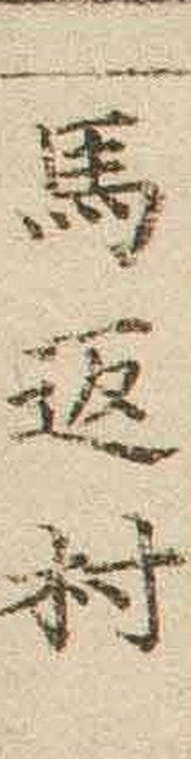馬返村

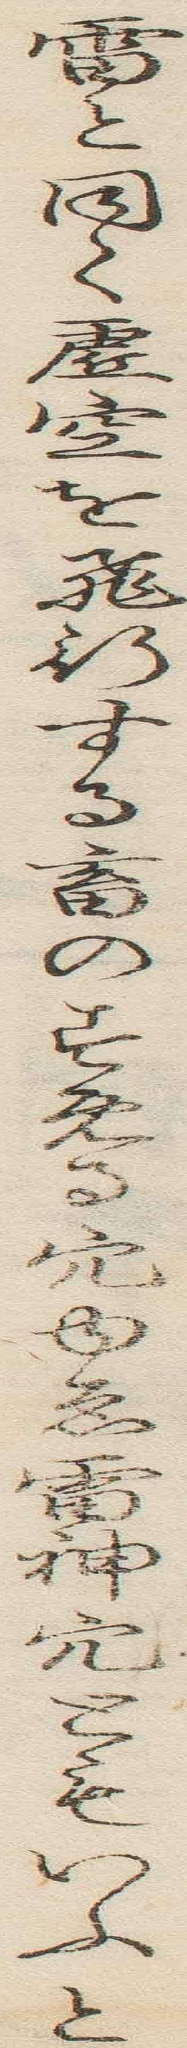雷と同く虗空を飛行する畜のすめる穴ゆゑ雷神穴ともいふと
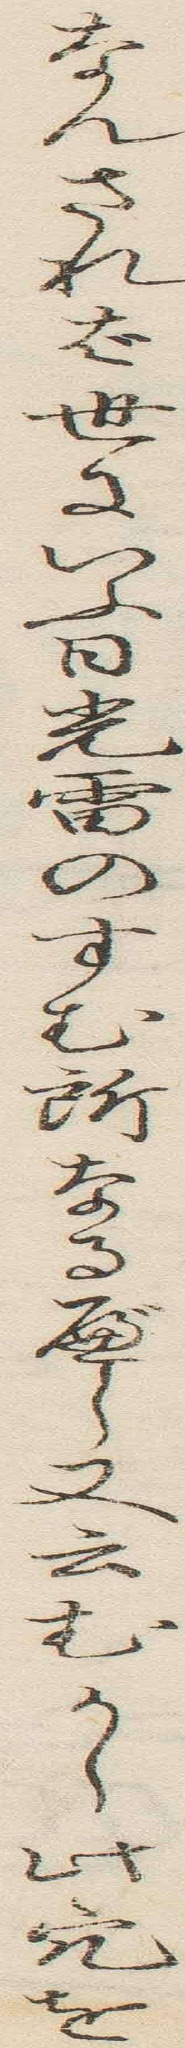なんされば世にいふ日光雷のすむ所なるべし又云むかし此穴を
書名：日光山志
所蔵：東京学芸大学附属図書館 国文学研究資料館
